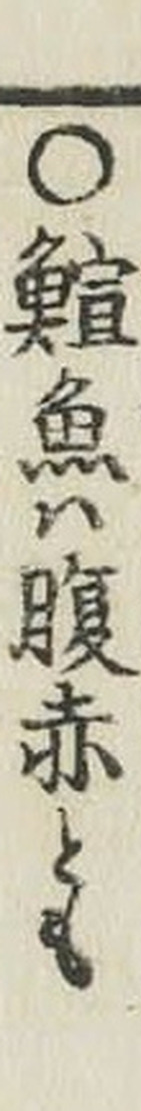○鰚魚は腹赤とも
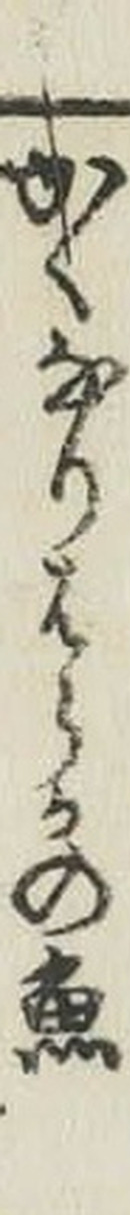かくなりはらかの魚
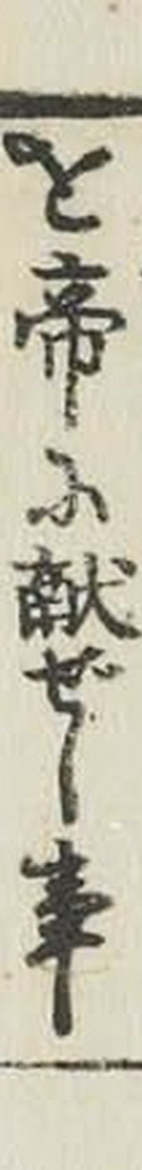を帝に献ぜし事
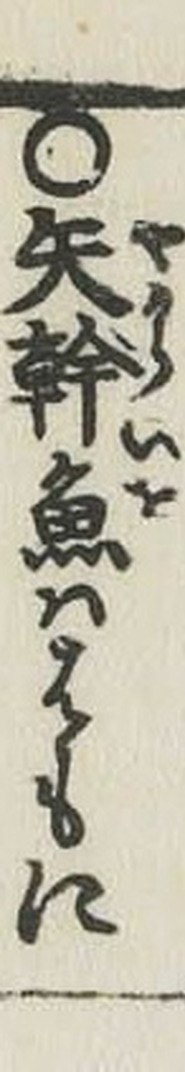○矢幹魚ははもに
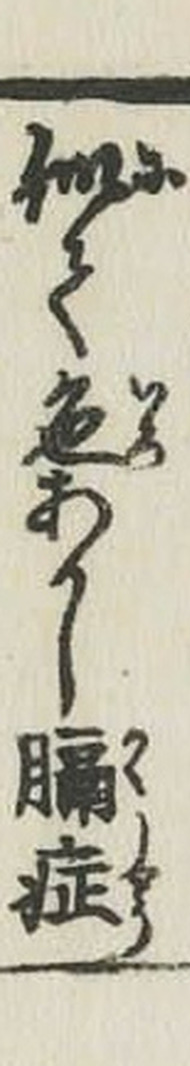似て色あかし膈症
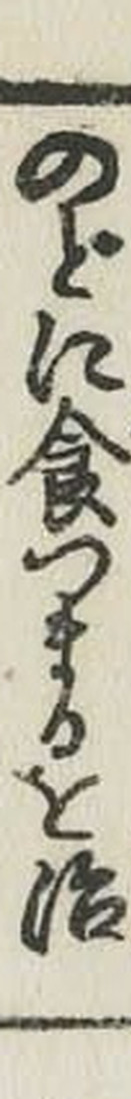のどに食つまるを治
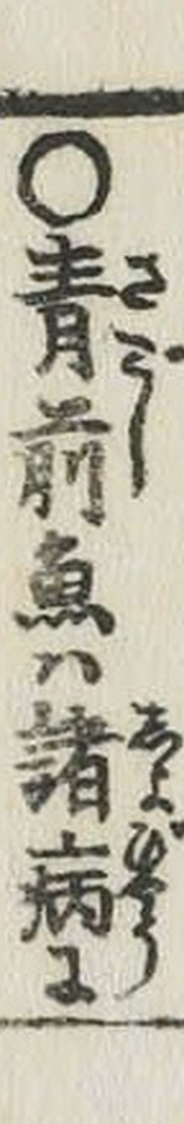○青前魚は諸病に
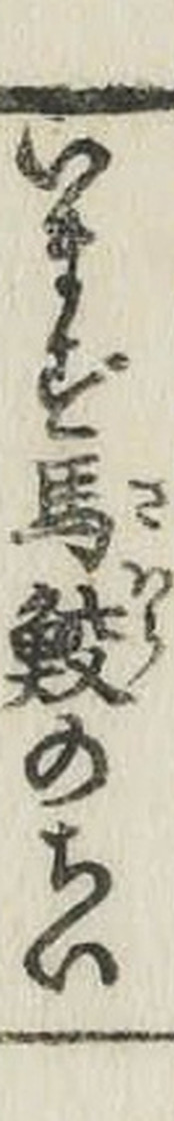いまず馬鮫のちい
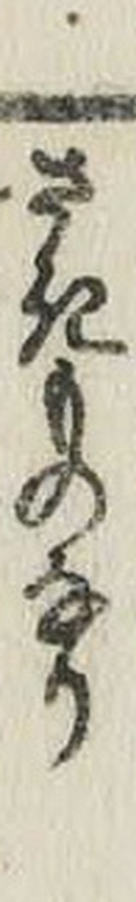さきものなり
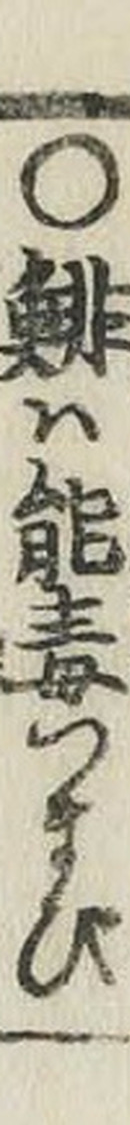○鯡は能毒つまび
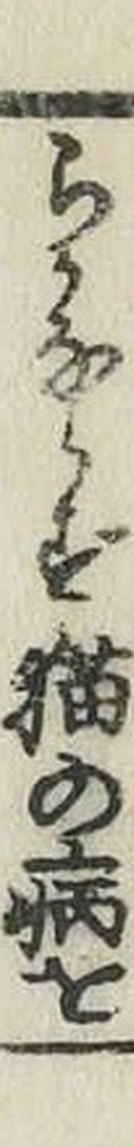らかならず猫の病を
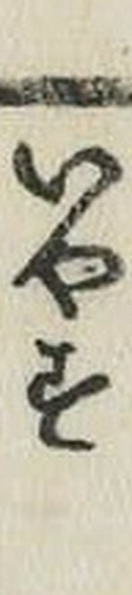いやす
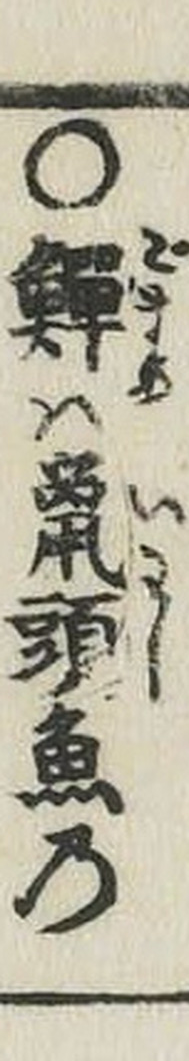○鱓は鼡頭魚の
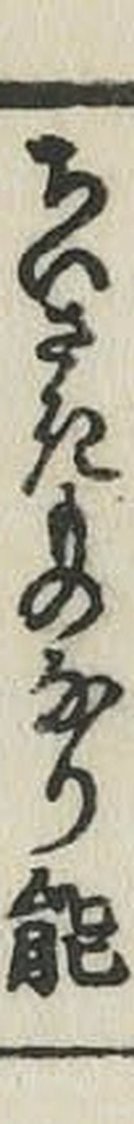ちいさきものなり能
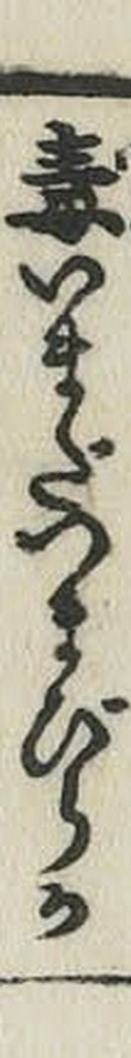毒いまだつまびらか
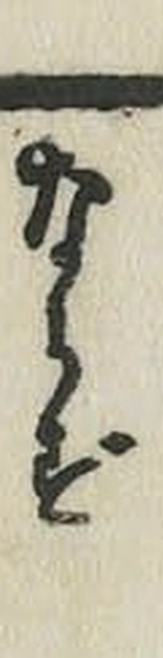ならず
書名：増補頭書訓蒙図彙大成 10巻 7:巻之14-16
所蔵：東京学芸大学教育コンテンツアーカイブ
